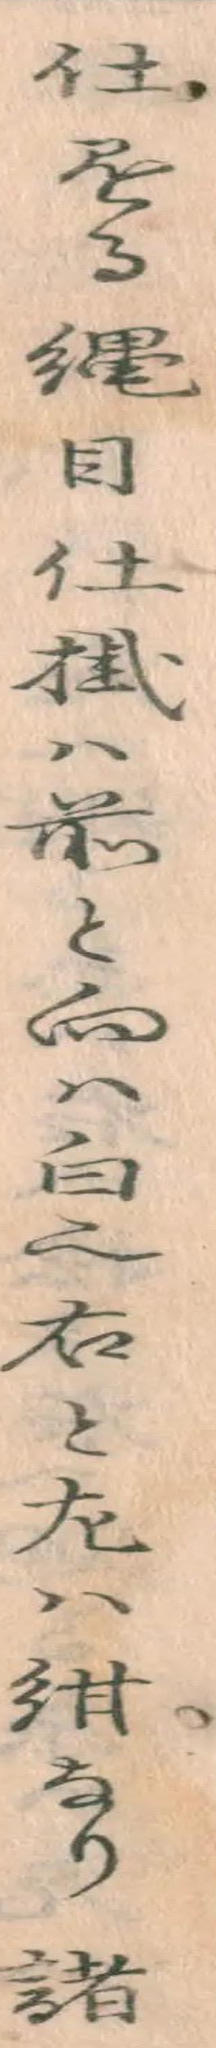仕懸る縄目仕掛は前と向は白也右と左は紺なり諸
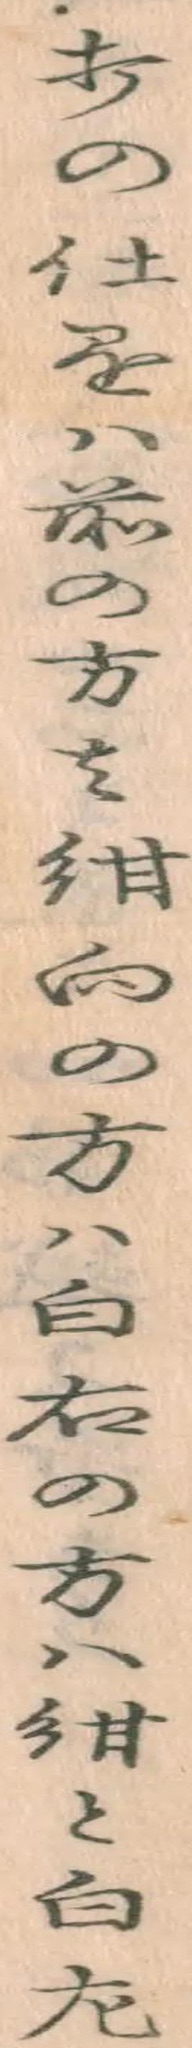打の仕懸は前の方は紺向の方は白右の方は紺と白左
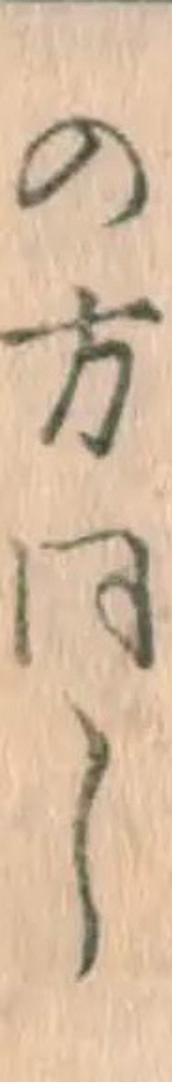の方同し
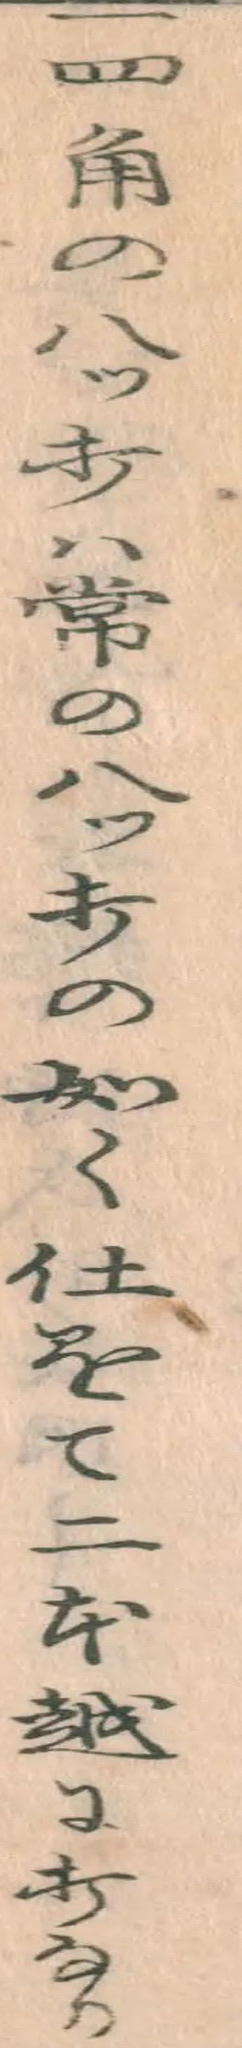一四角の八ッ打は常の八ッ打の如く仕懸て二本越に打なり
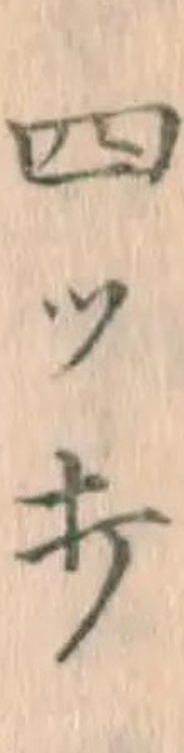四ッ打
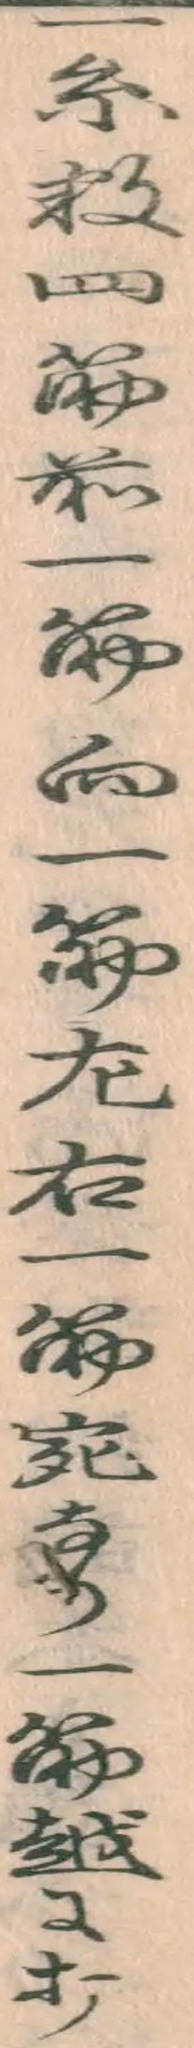一糸数四筋前一筋向一筋左右一筋宛なり一筋越に打
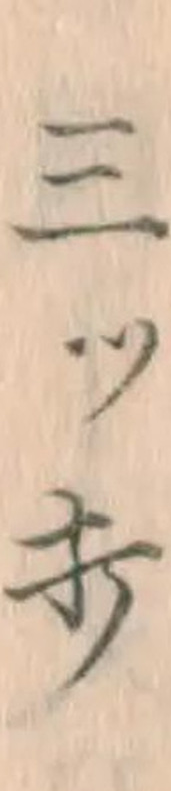三ッ打
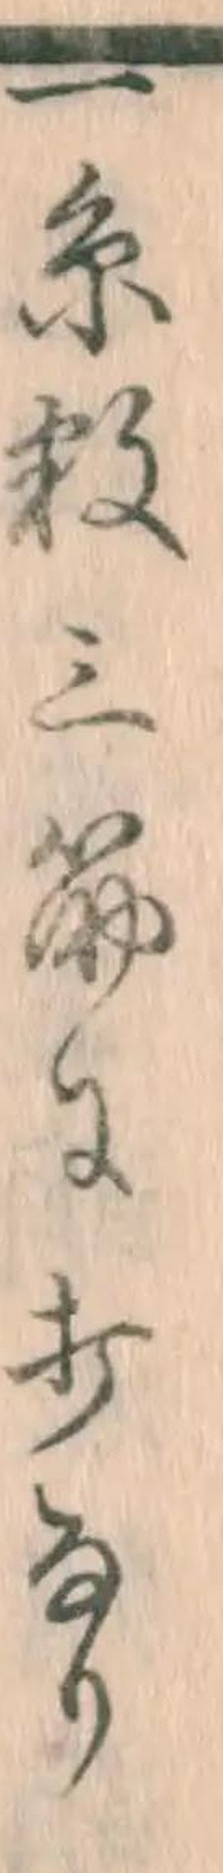一糸数三筋に打なり
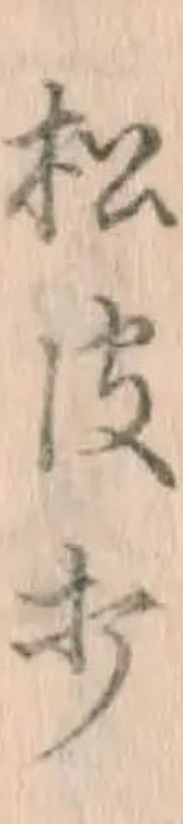松皮打
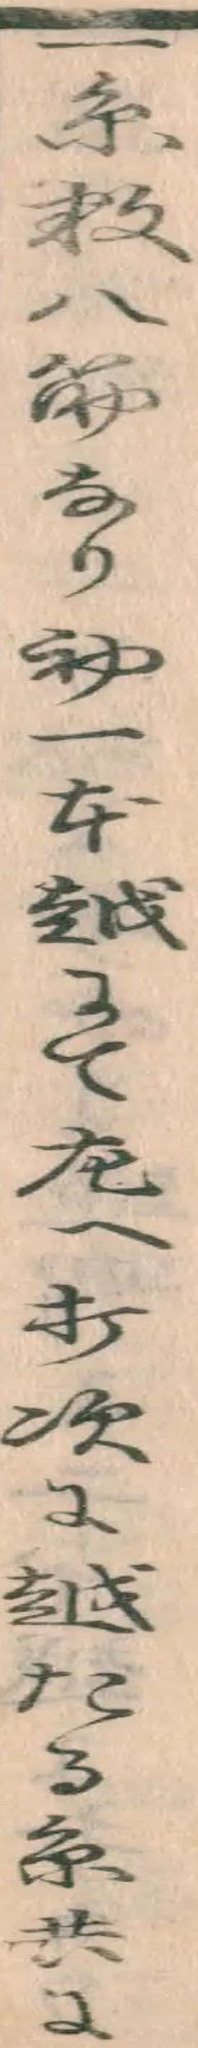一糸数八筋なり初一本越にて左へ打次に越たる糸共に
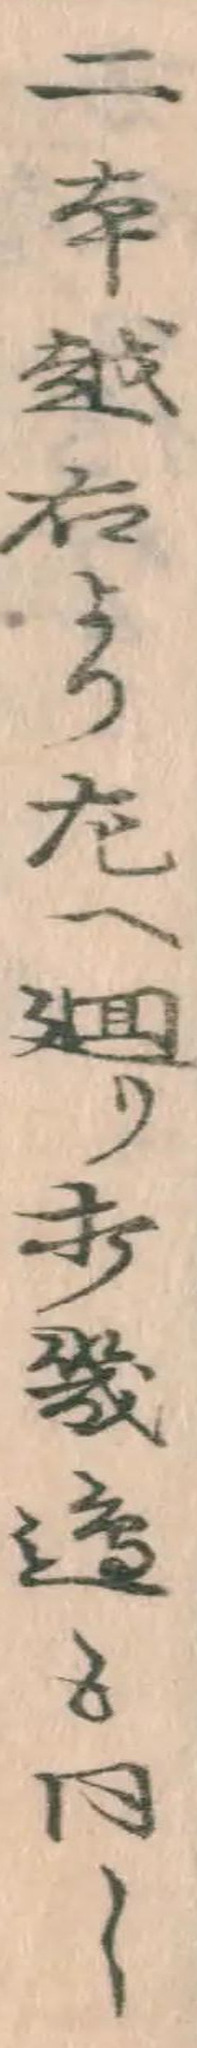二本越右より左へ廻り打幾辺も同し
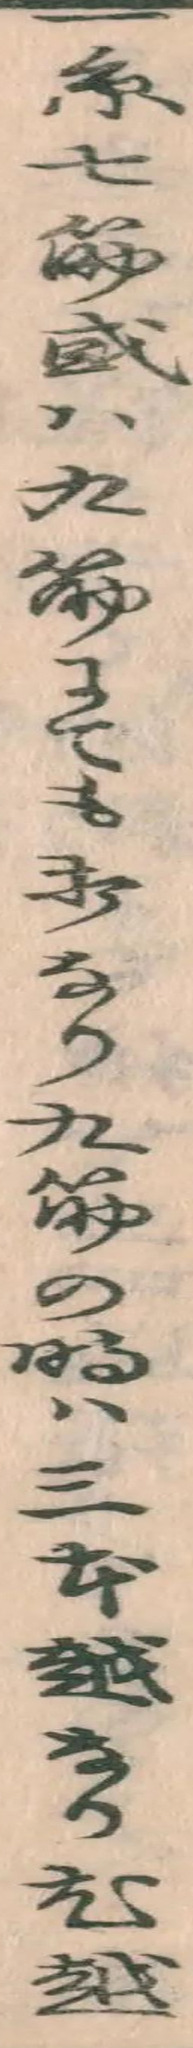一糸七筋或は九筋にても打なり九筋の時は三本越なり尤越
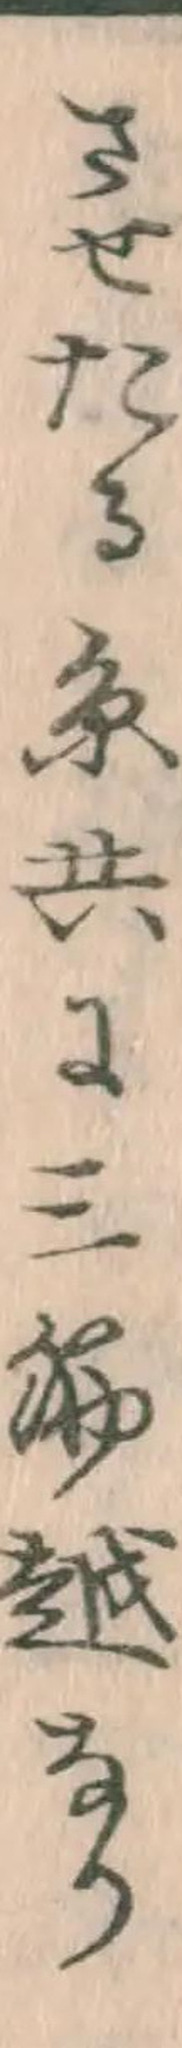させたる糸共に三筋越なり
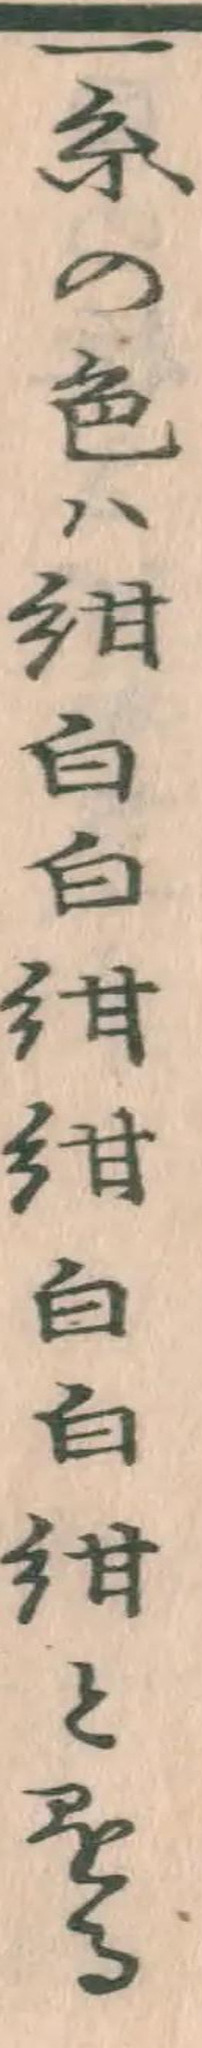一糸の色は紺白白紺紺白白紺と懸る
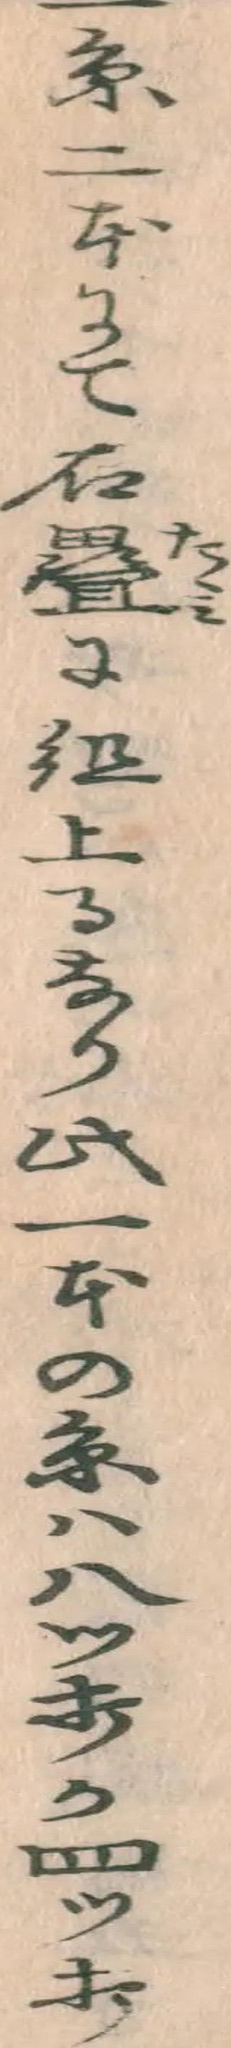一糸二本にて石畳に組上るなり此一本の糸は八ッ打か四ッ打
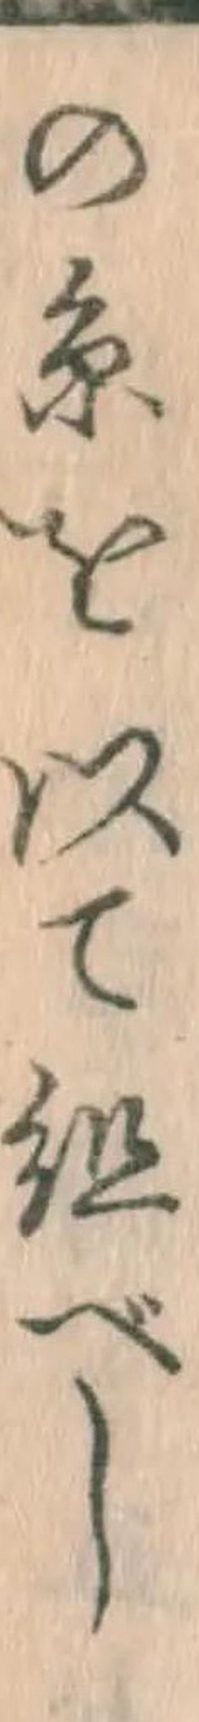の糸を以て組べし
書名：機織彙編 5巻. [2]
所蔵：国立国会図書館 National Diet Library, JAPAN
